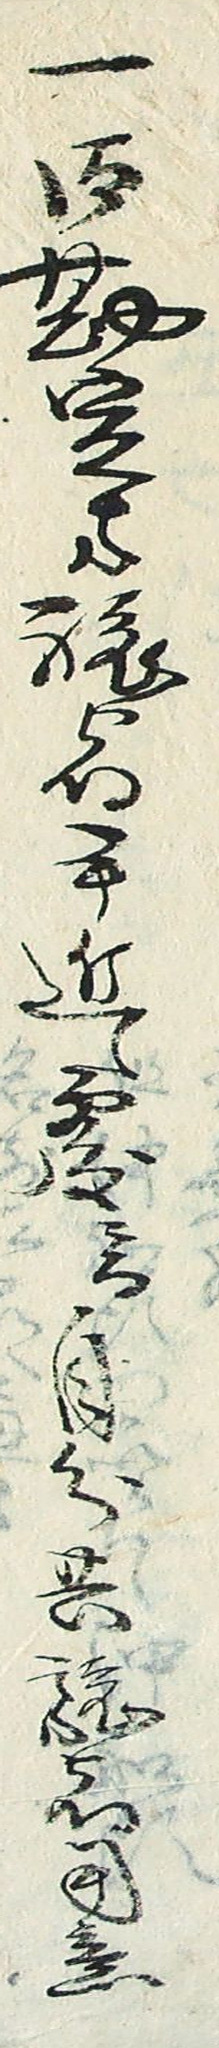一御勘定方旅宿手近之処にて自分共旅宿用意

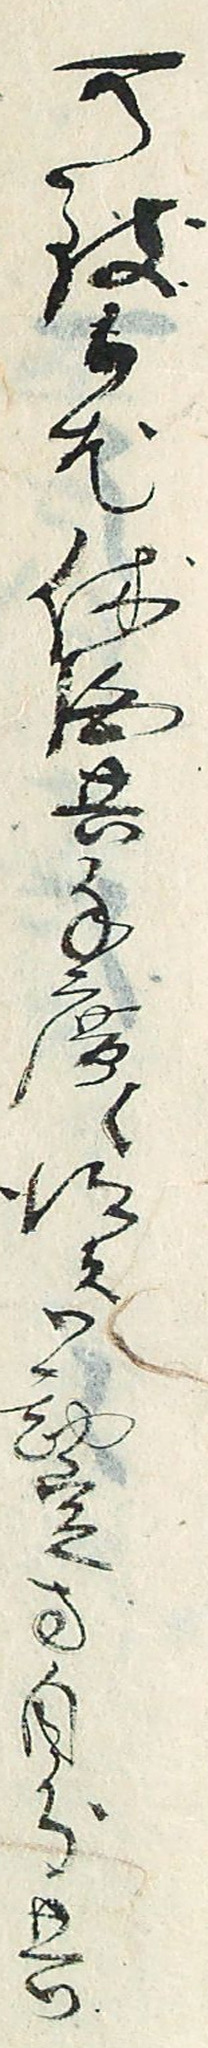可致候尤休泊共手広候得は御勘定方自分共
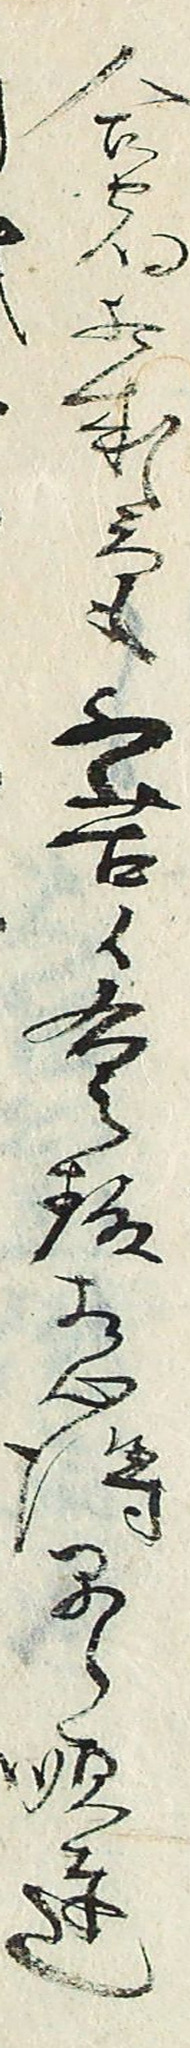合宿相成候ても不苦候右之趣相心得順達
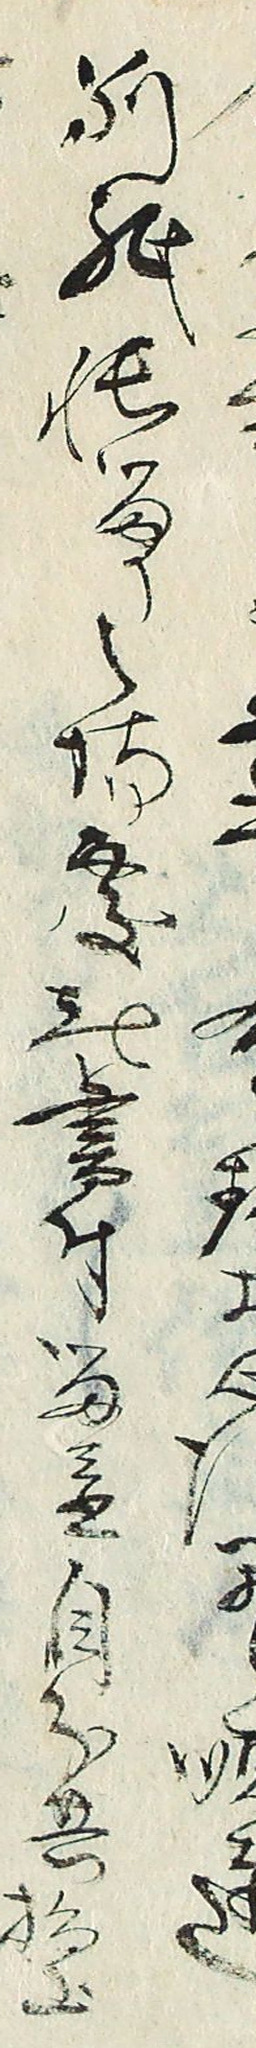別紙帳留り之場処此書付留置自分共指上
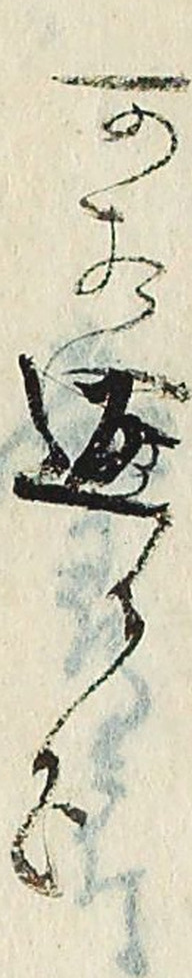可相返候以上
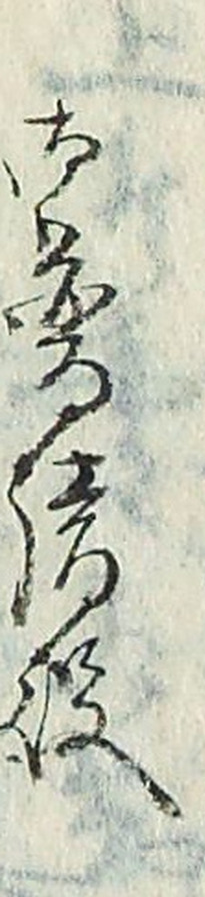御普請役
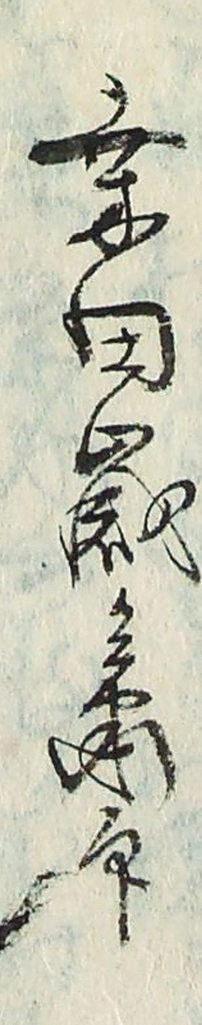桑田歳兵衛印
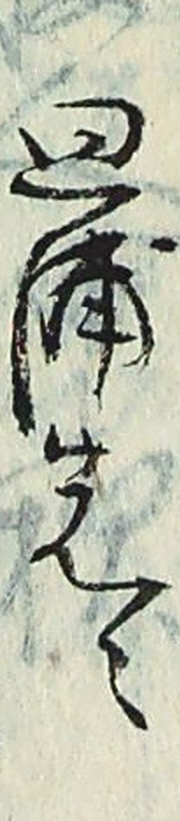廻浦先々
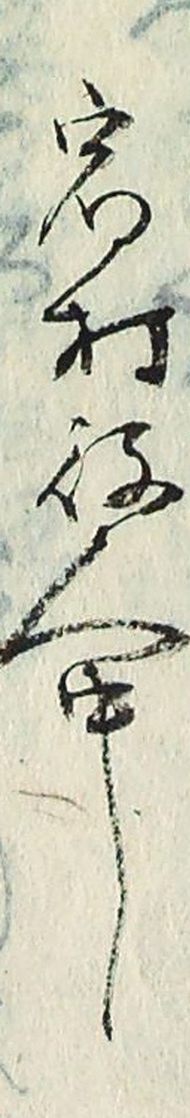宿村役人中
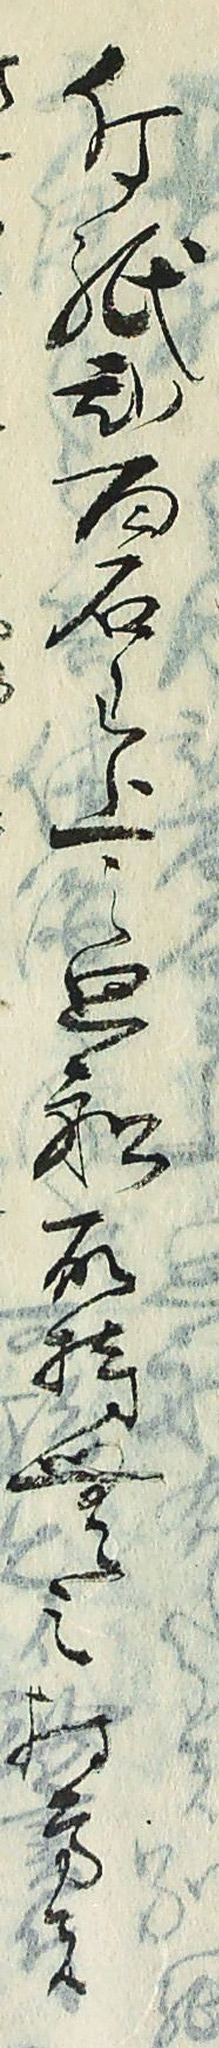付紙弐百石已上之廻船取持無之村方は
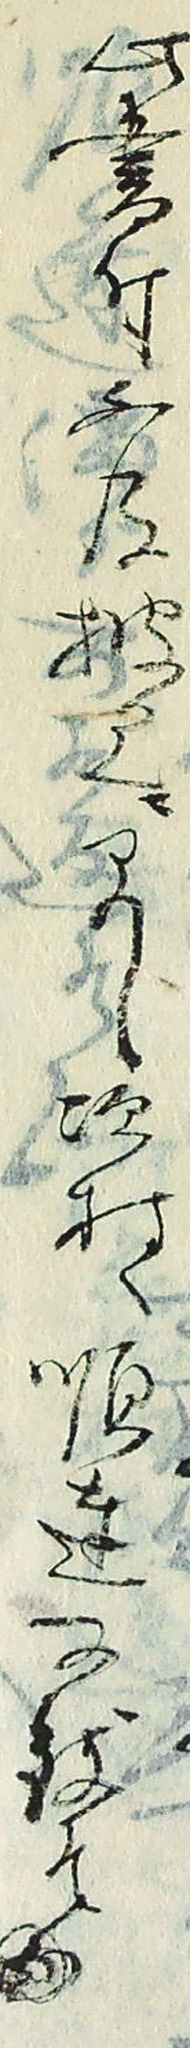此書付不及披見に早々次村へ順達可致候
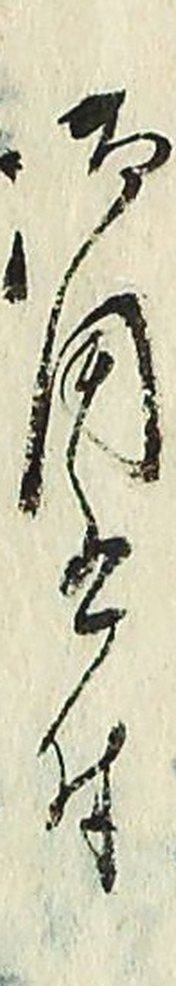御用書付
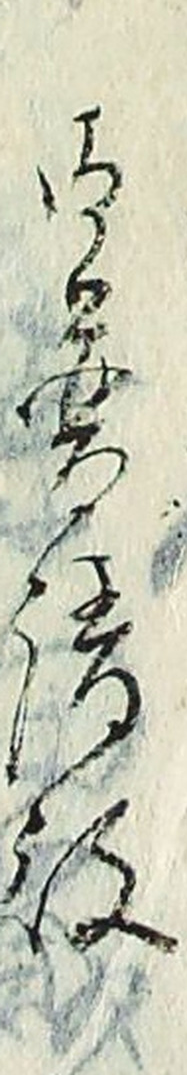御普請役
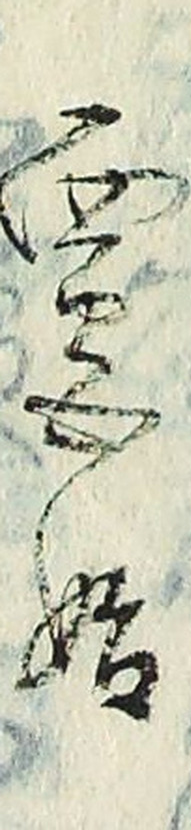西宮始
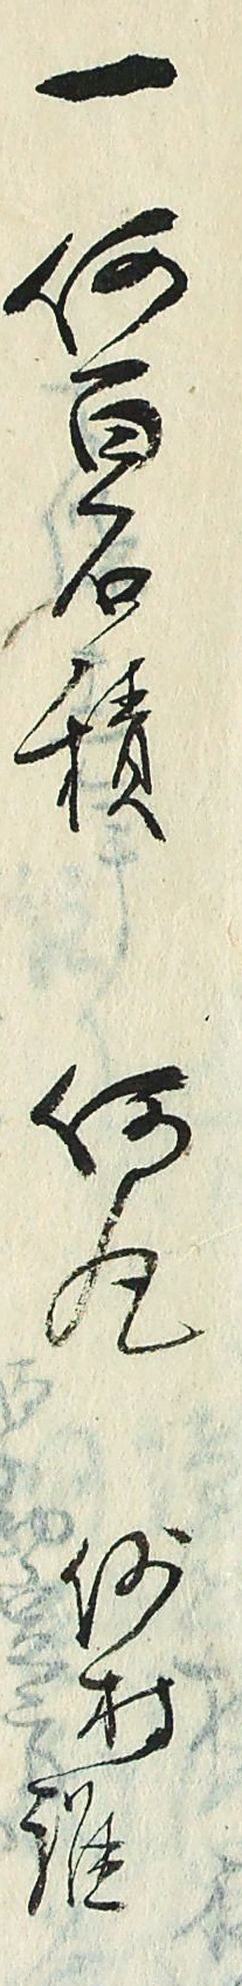一何百石積何丸何村
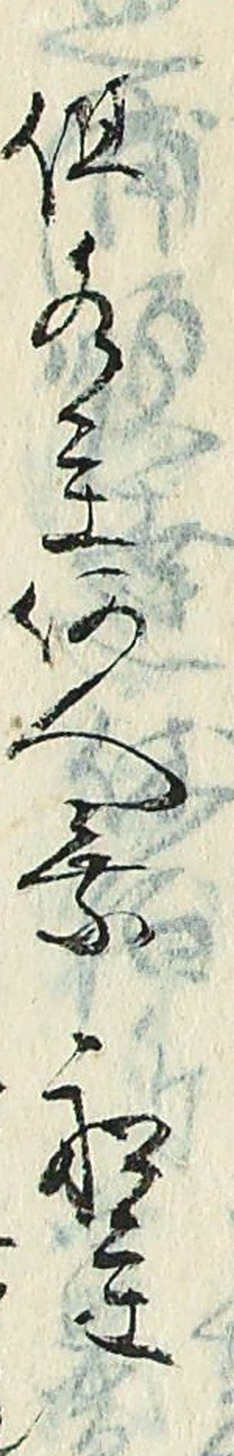但水主何人乗船主
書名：公辺御役人為御廻浦御立越諸御用一巻
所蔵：鳴門教育大学 Naruto University of Education
